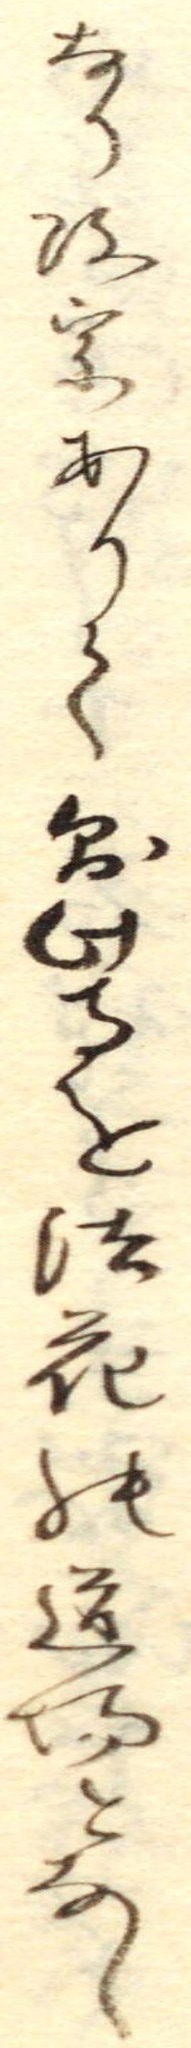なり改宗ありて則此寺を法花の道場となし
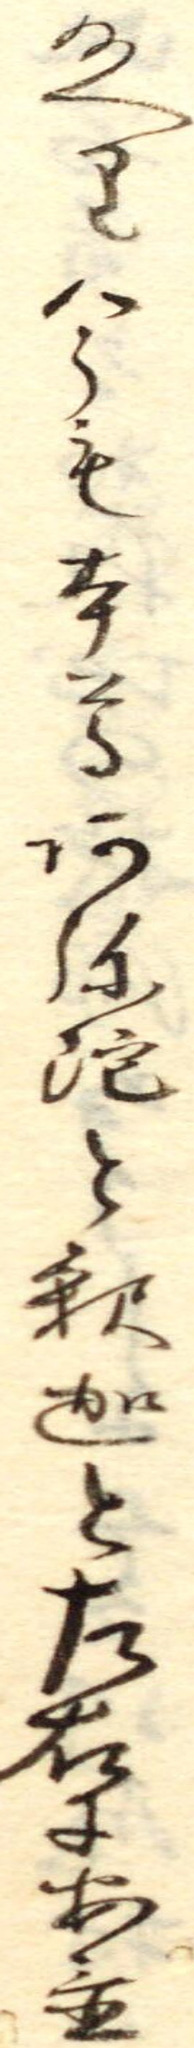給へり今も本尊阿弥陀と釈迦と左右に安置
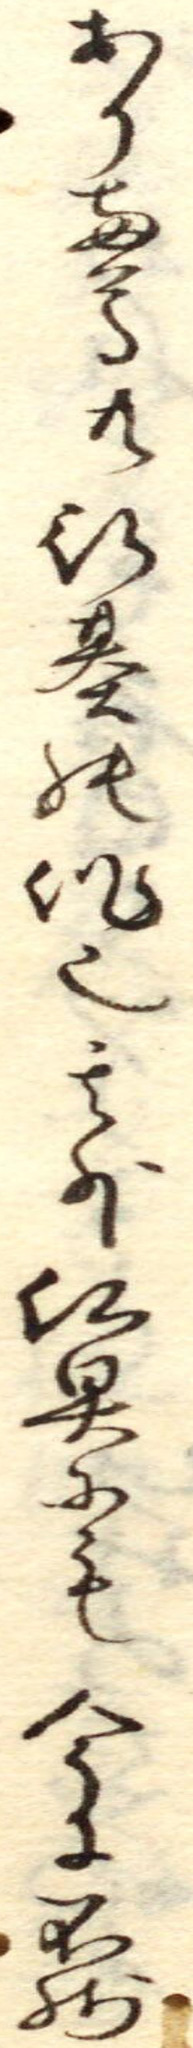あり両尊共行基の作也其外仏具にも今に不残
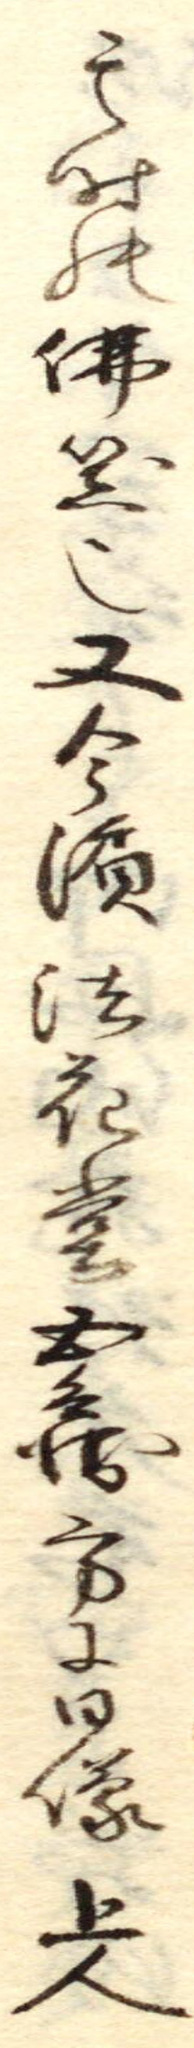其時の仏器也又今濱法花堂五兵衛方に日像上人
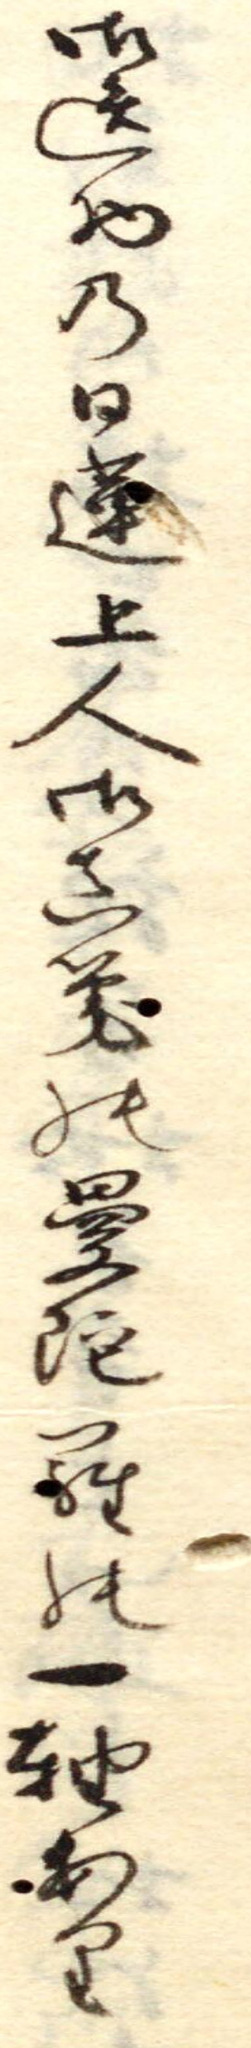御送物の日蓮上人御真筆の曼荼羅の一軸あり
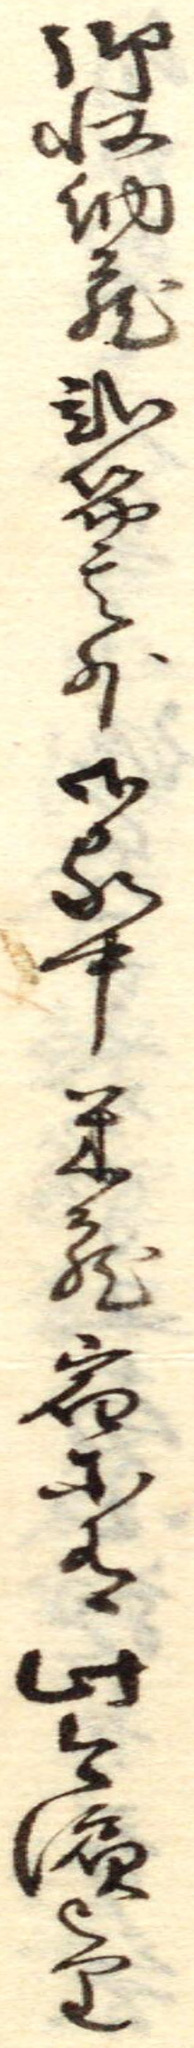御収納蔵弐筋其外御家中米蔵宿等有此今濱より
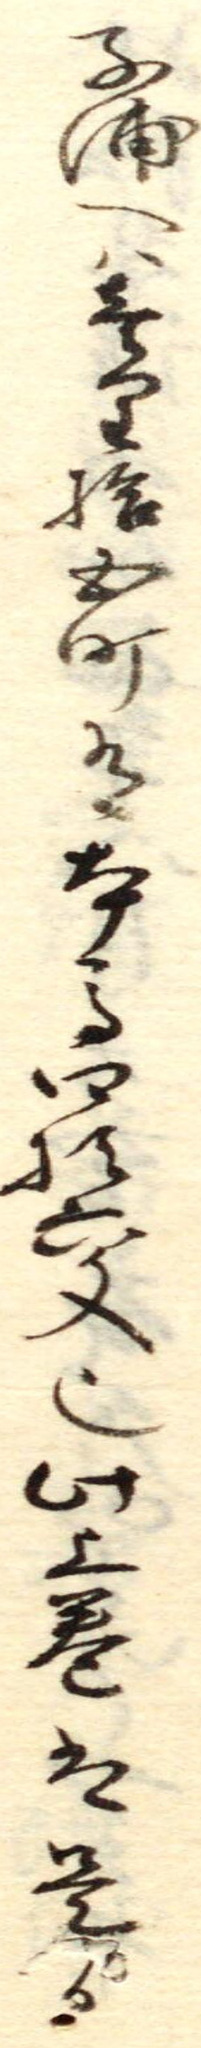子浦へは壱里拾五町有本馬四拾六文也此上巻は是ゟ
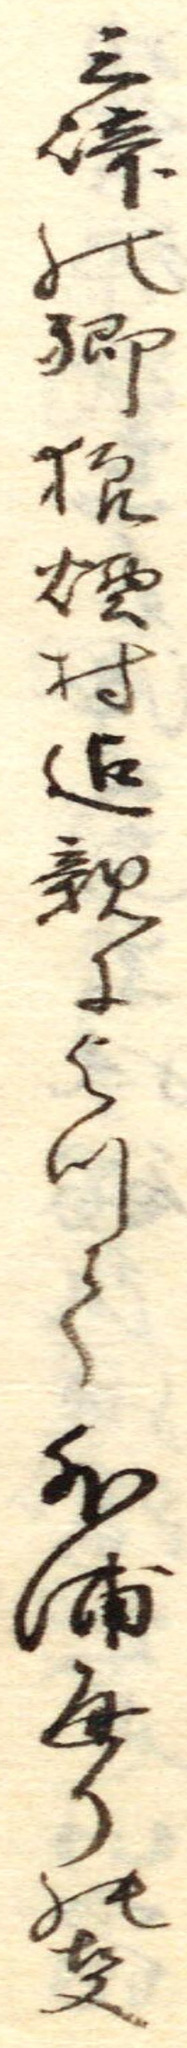三崎の郷狼煙迄親によつて外浦通りの事
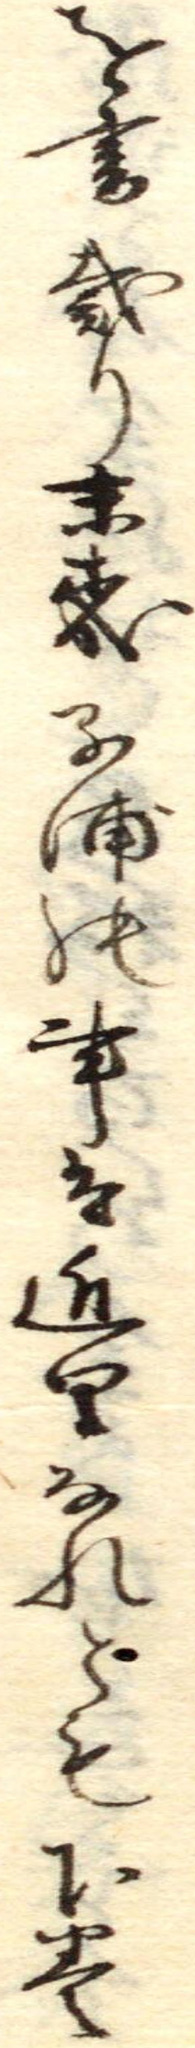を書載り末森子浦の事近里なれとも下巻
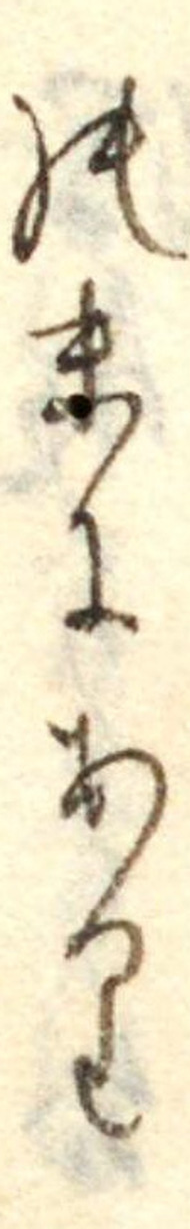の末にあり
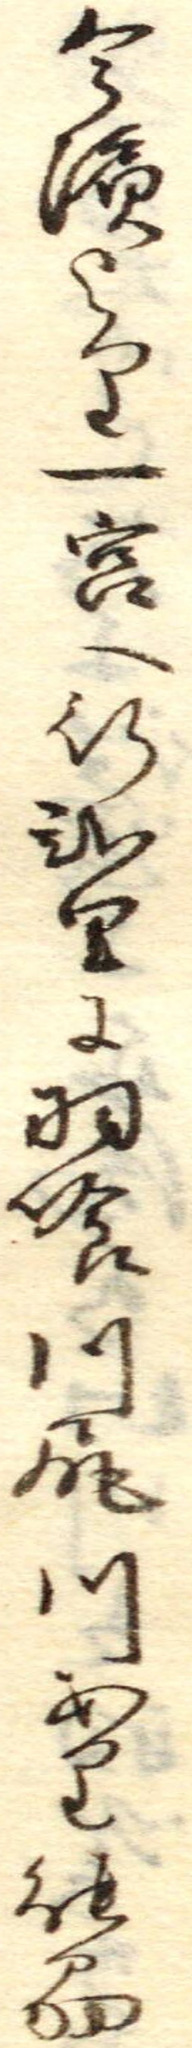今濱より一宮へ行弐里に羽喰川尻川あり能州

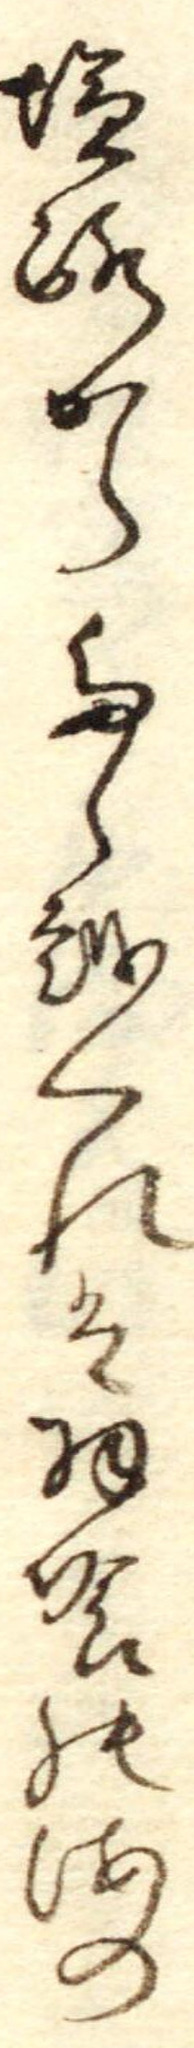塩路から多く越くれは羽喰の海の
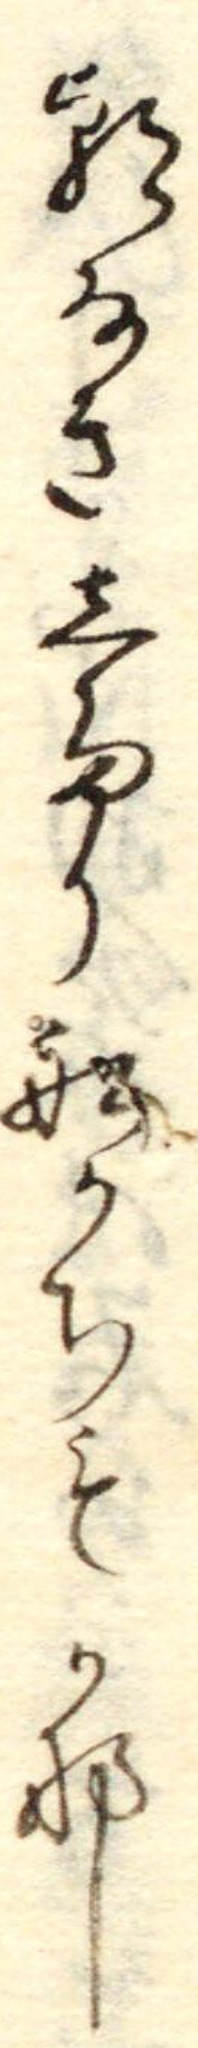朝なきしたり船かちもかな
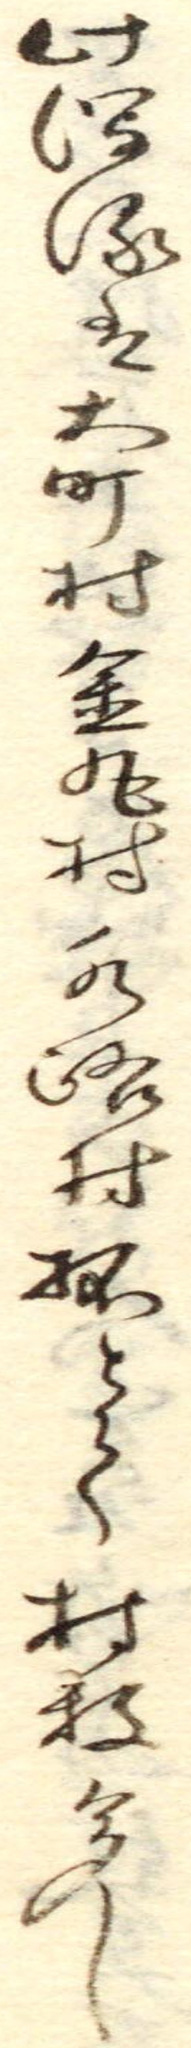此潟縁は大町村金丸村水路村抔とて村数多し
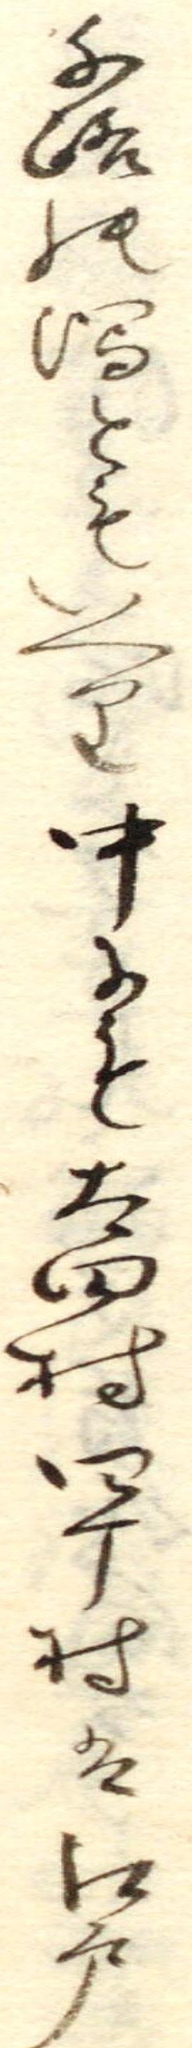千路の潟ともいへり中にも大田村四丁村は江戸
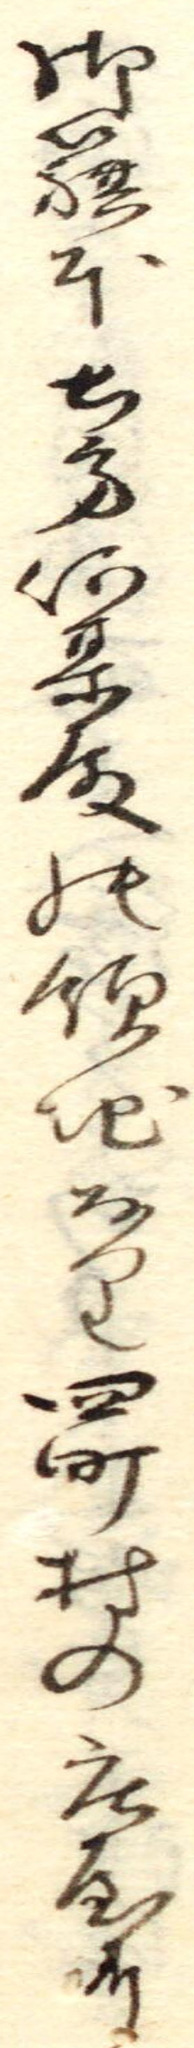御旗本土方何某殿の領地なり四町村の庄屋に
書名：能登名跡誌
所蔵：Ishikawa Prefectural Library
